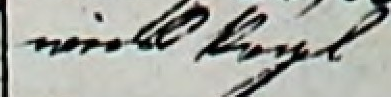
wiek kogl
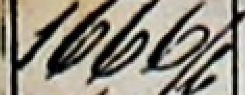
1666/b
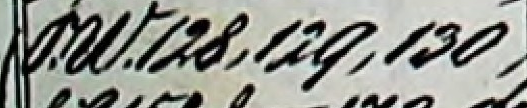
P.W. 128, 129, 130
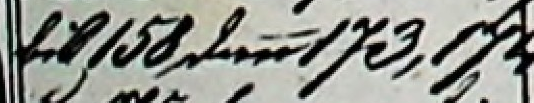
bis 158 dann 173, 174
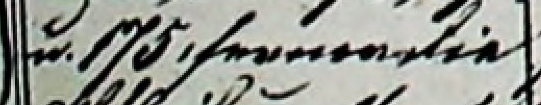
u. 175, fernen die
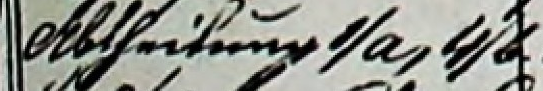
Abtheilung 1/a, 4/b
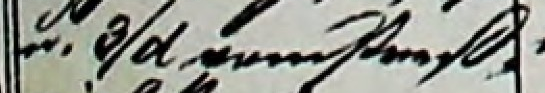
u. 3/d vom Preß„
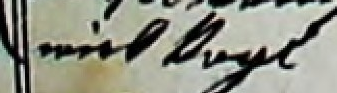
wiek kogl
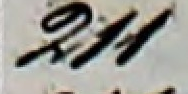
211
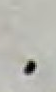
„
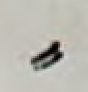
„
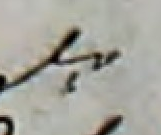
Do
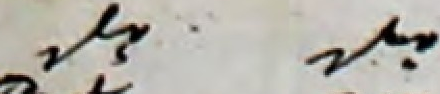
Do Do
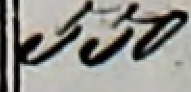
550
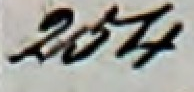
254
